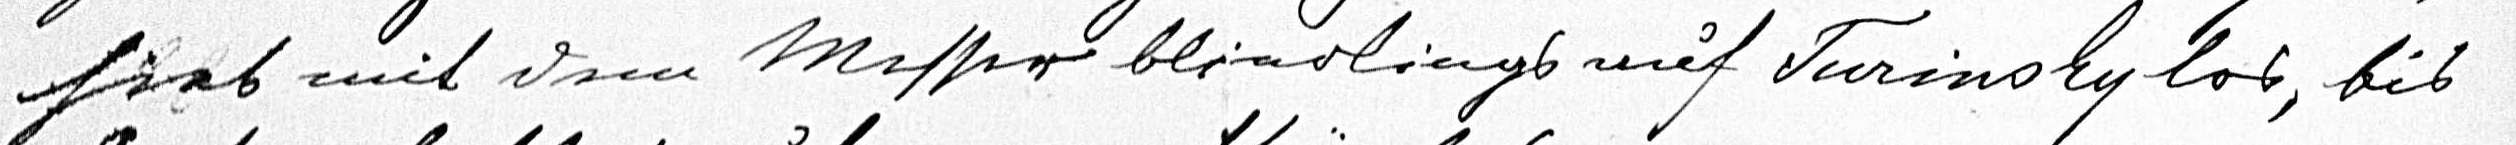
hieb mit dem Messer blindlings auf Turinsky los, bis
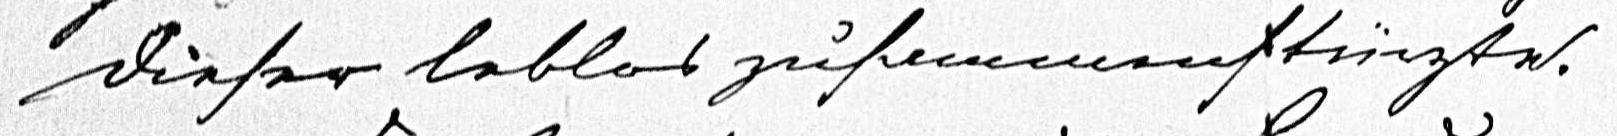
dieser leblos zusammen stürzte.
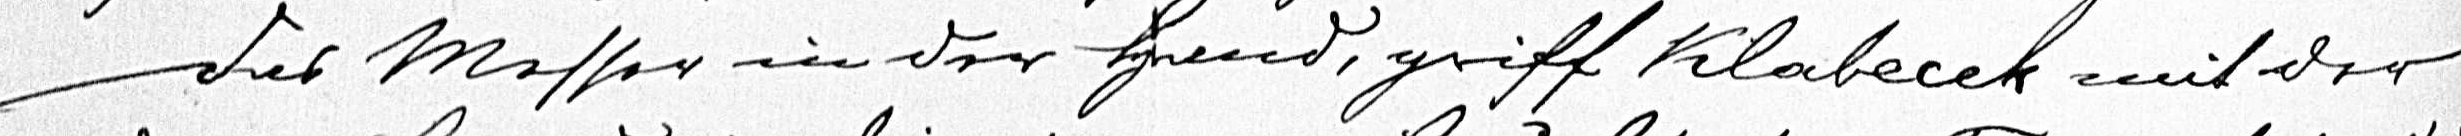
Das Messer in der Hand, griff Klabeček mit der
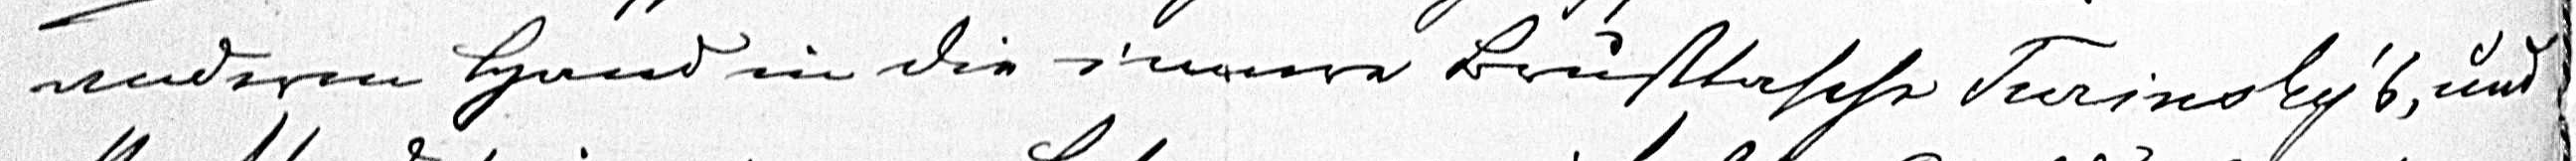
anderen Hand in die innere Brusttasche Turinsky’s, und
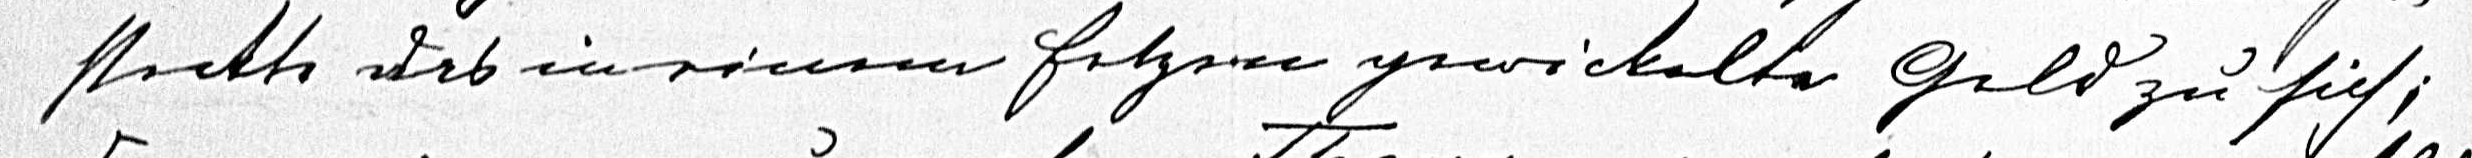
steckte das in einem Fetzen gewickelte Geld zu sich;
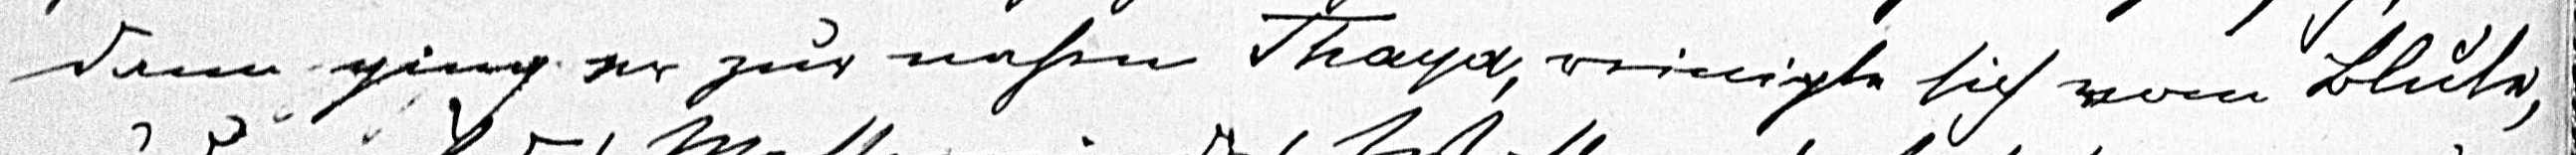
dann ging er zur nahen Thaya, reinigte sich vom Blute,
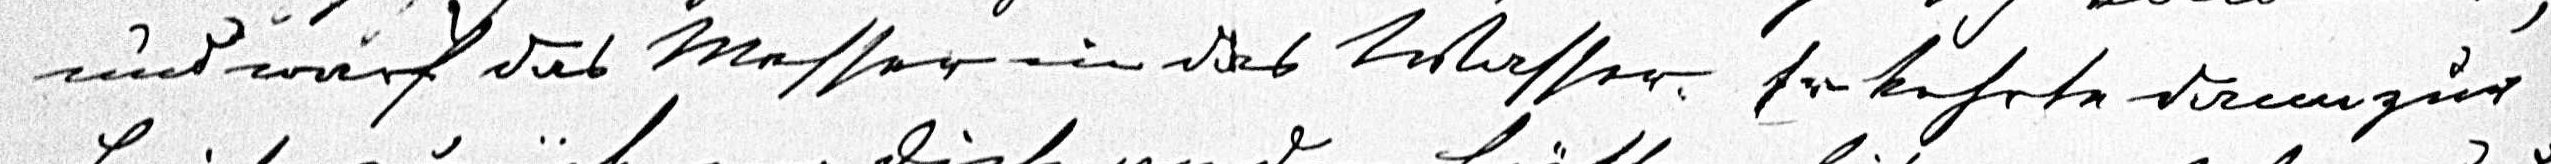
und warf das Messer in das Wasser. Er kehrte dann zur
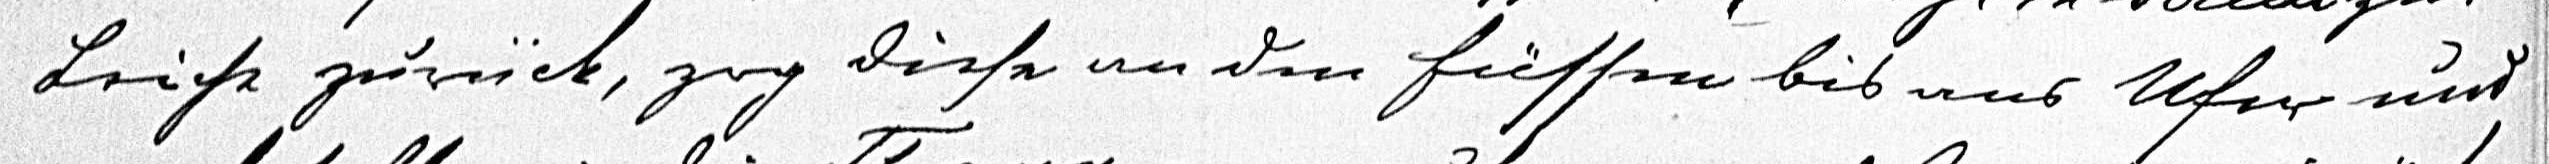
Leiche zurück, zog diese an den Füssen bis ans Ufer und
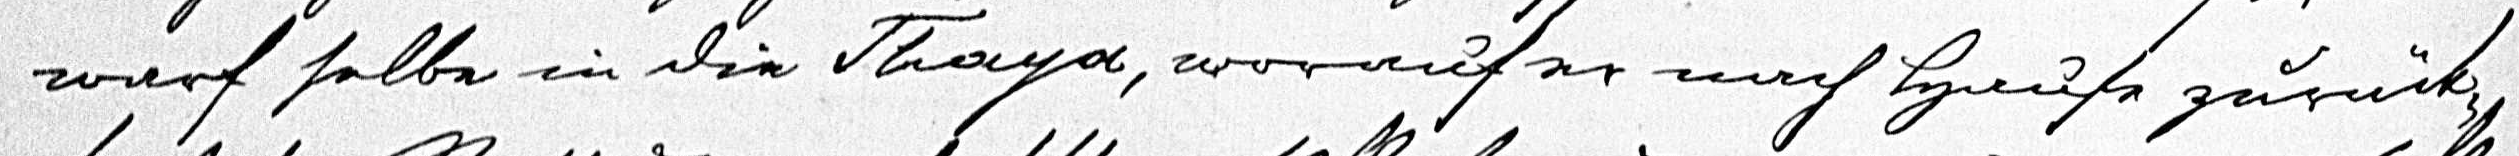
warf selbe in die Thaya, worauf er nach Hause zurück¬
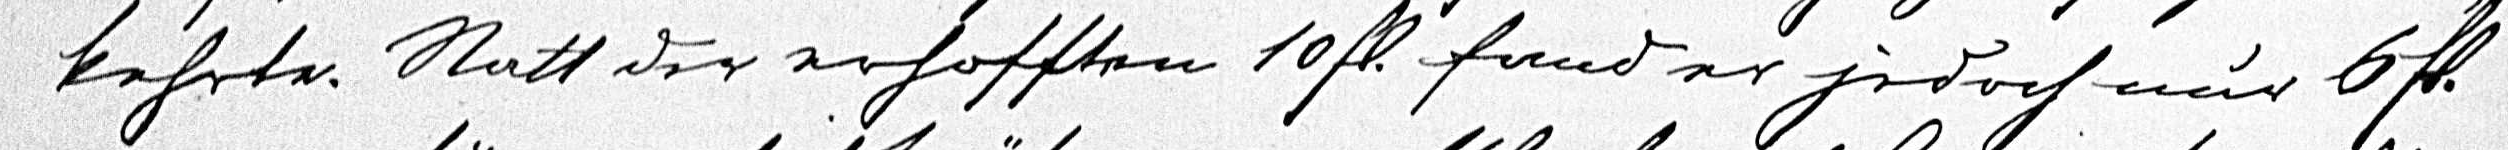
kehrte. Statt der erhofften 10fl. Fand er jedoch nur 6fl.
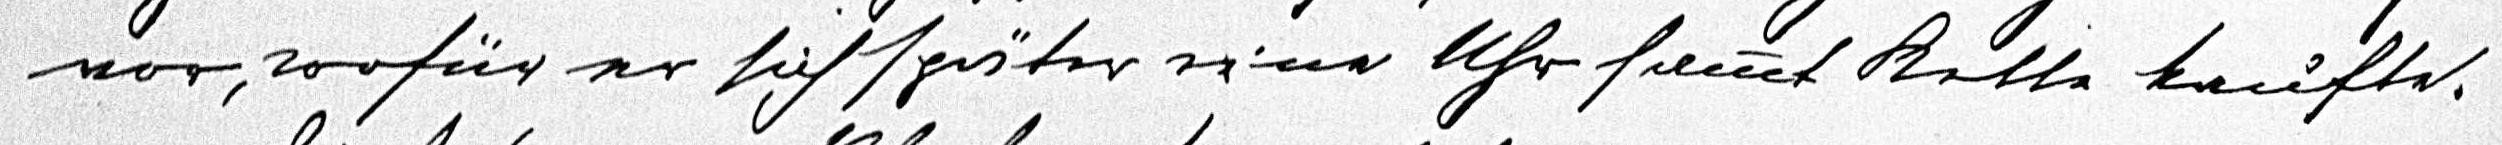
vor, wofür er sich später eine Uhr sammt Kette kaufte.
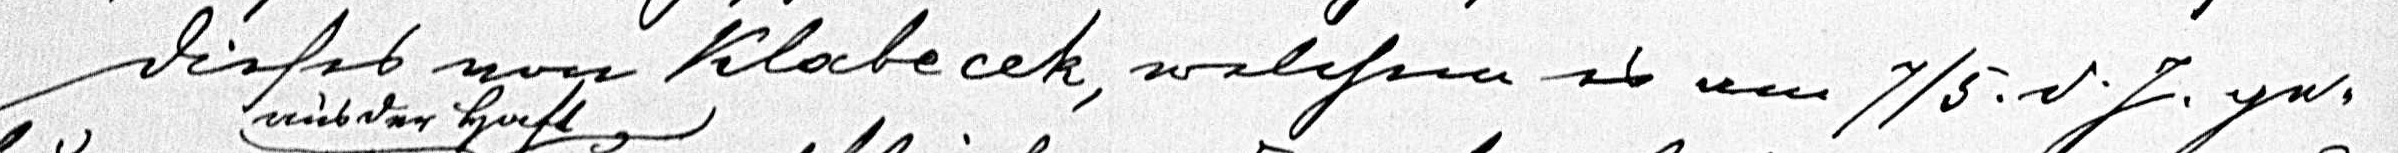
Dieses von Klabeček, welchem es am 7/5 d. J. ge¬
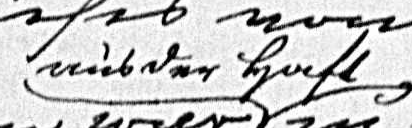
aus der Haft
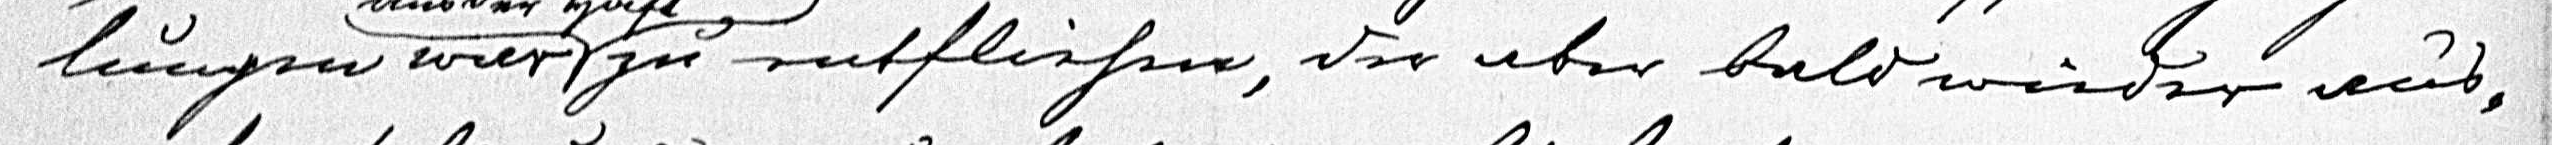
lungen war zu entfliehen, der aber bald wieder aus¬
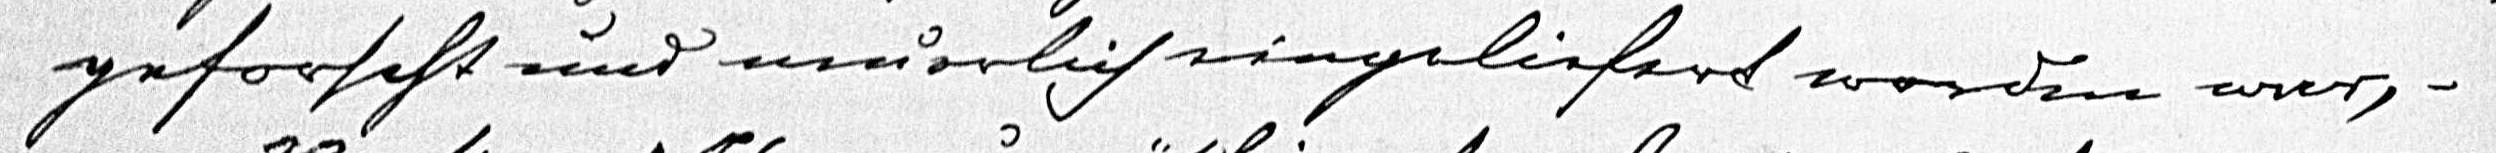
geforscht und neuerlich eingeliefert worde war,
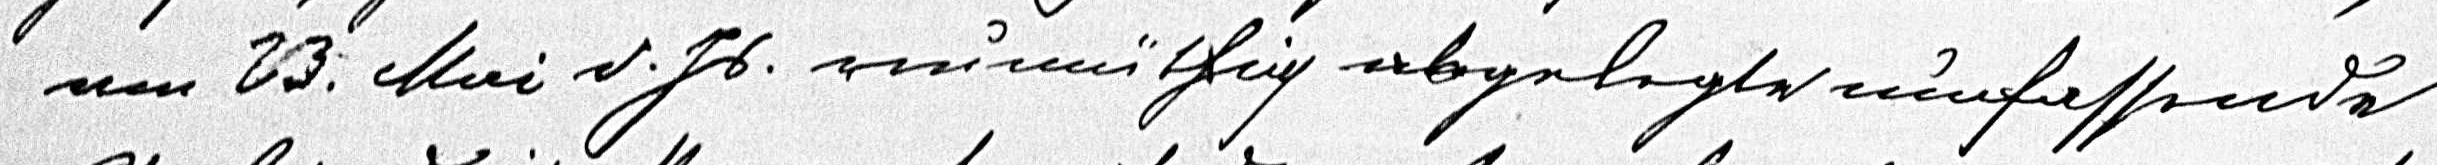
am 23. Mai d. Js reumüthig abgelegte umfassende
